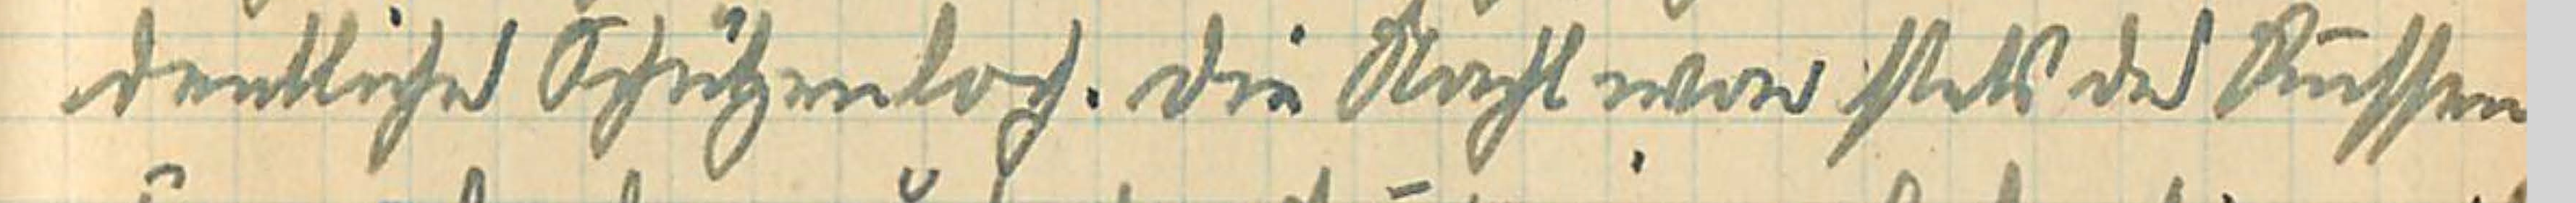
dentliches Schützenloch. Die Nacht war stets des Russen
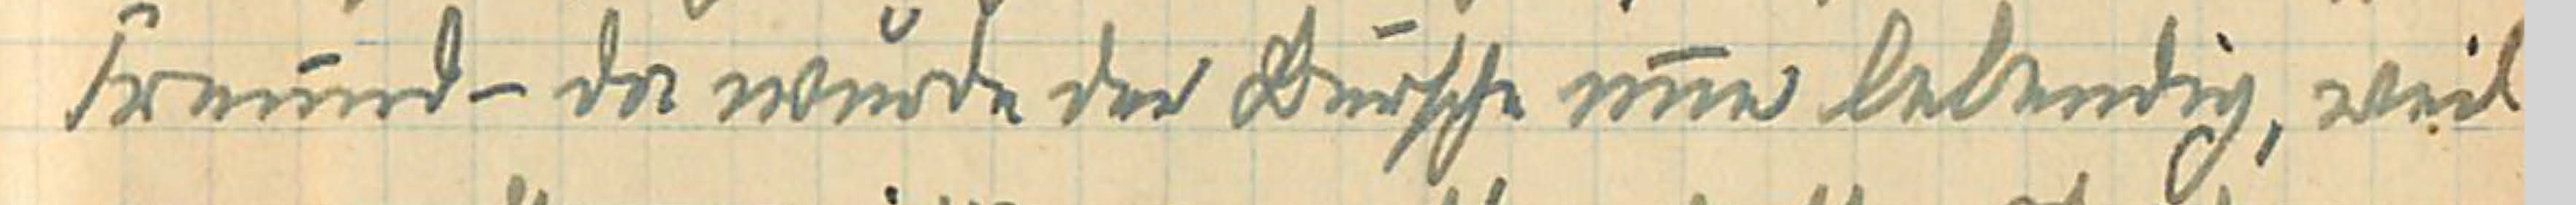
Freund – da wurde der Bursche immer lebendig, weil
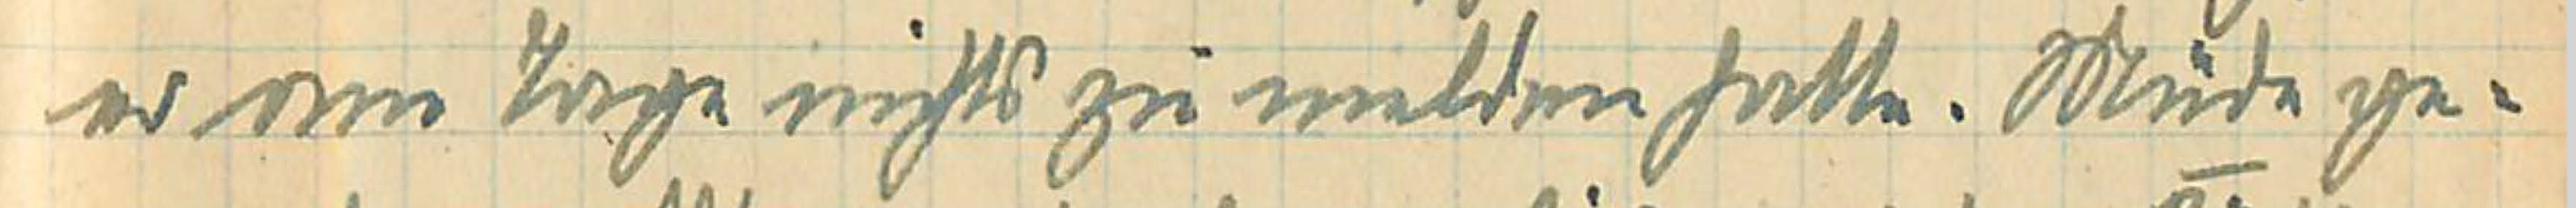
er am Tage nichts zu melden hatte. Müde ge-
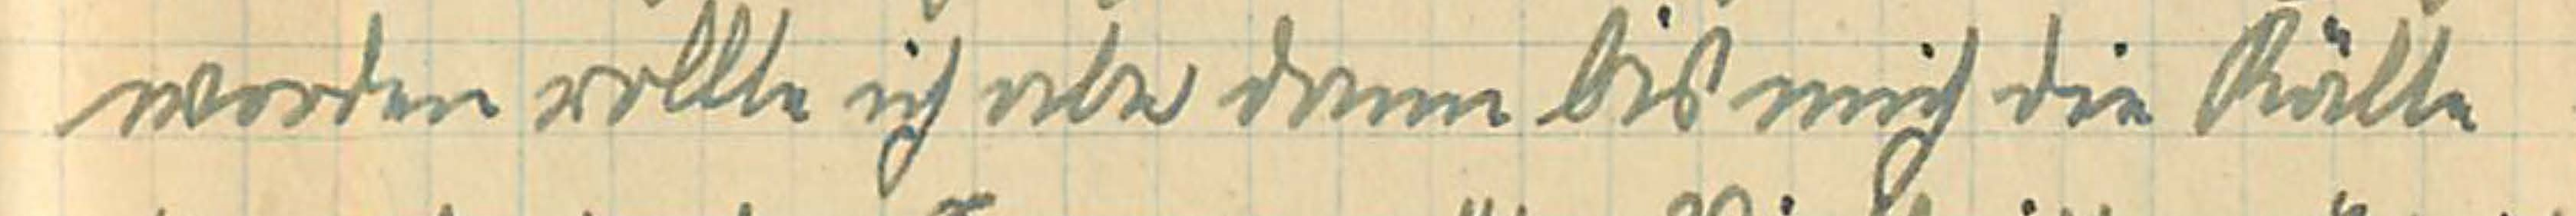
worden rollte ich aber dann bis mich die Kälte
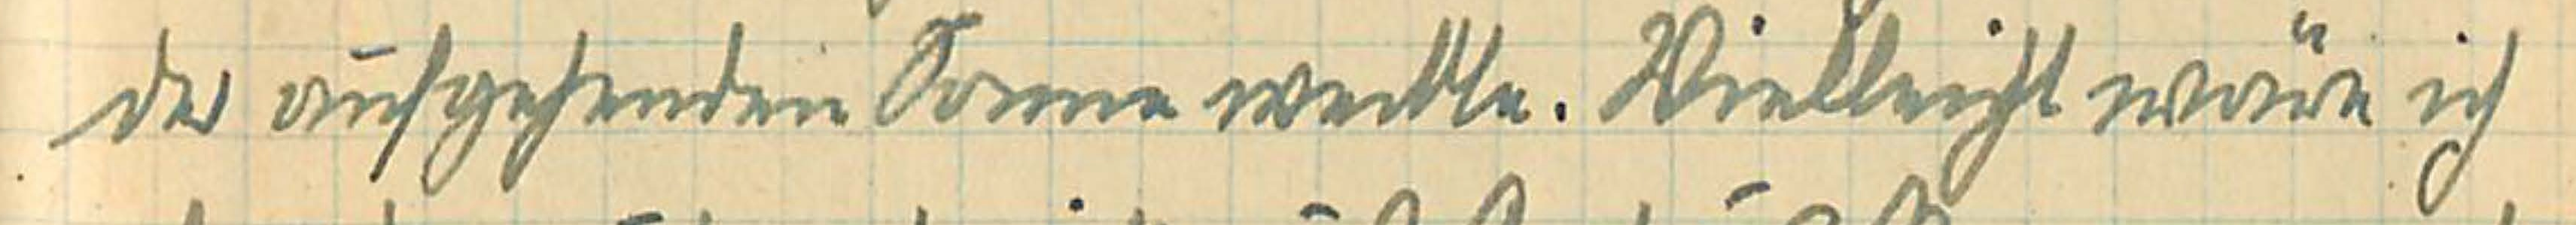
der aufgehenden Sonne weckte. Vielleicht wäre ich
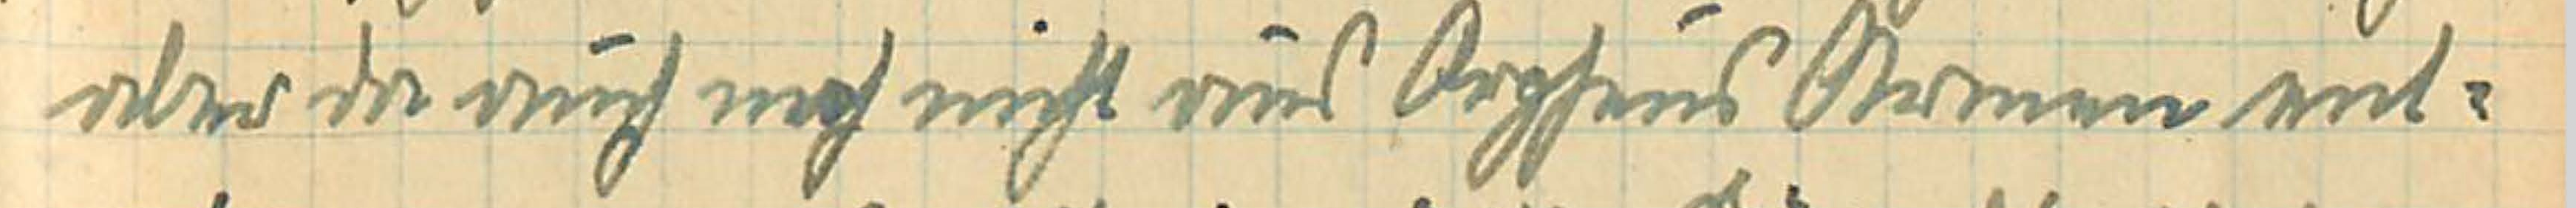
aber da auch noch nicht aus Orpheus Armen ent-
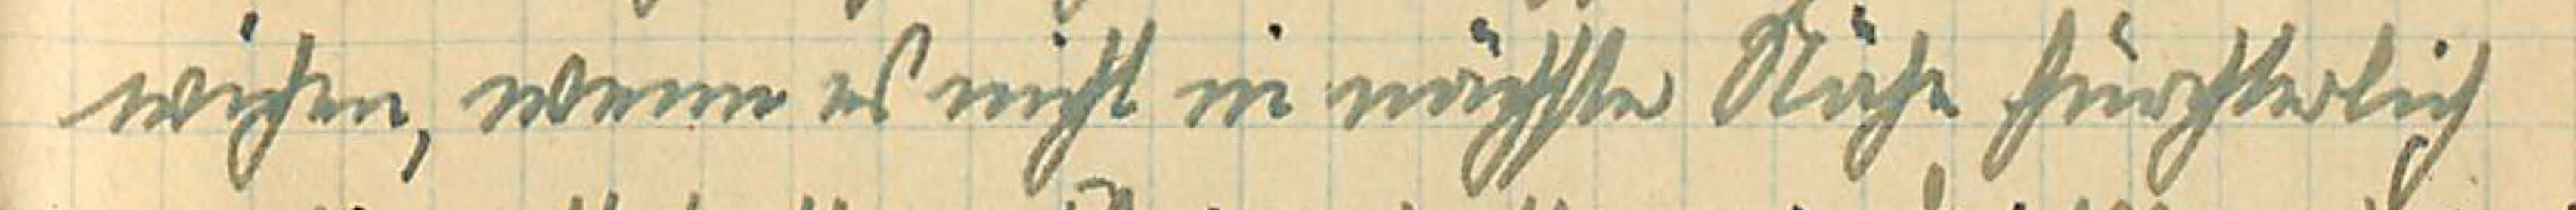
wichen, wenn es nicht in nächster Nähe fürchterlich
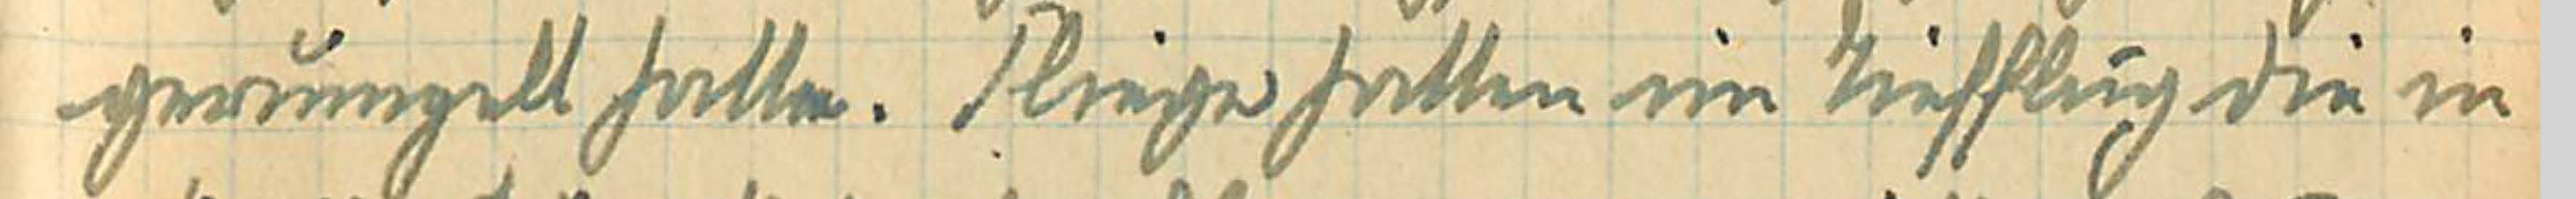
gerumpelt hatte. Flieger hatten im Tiefflug die in
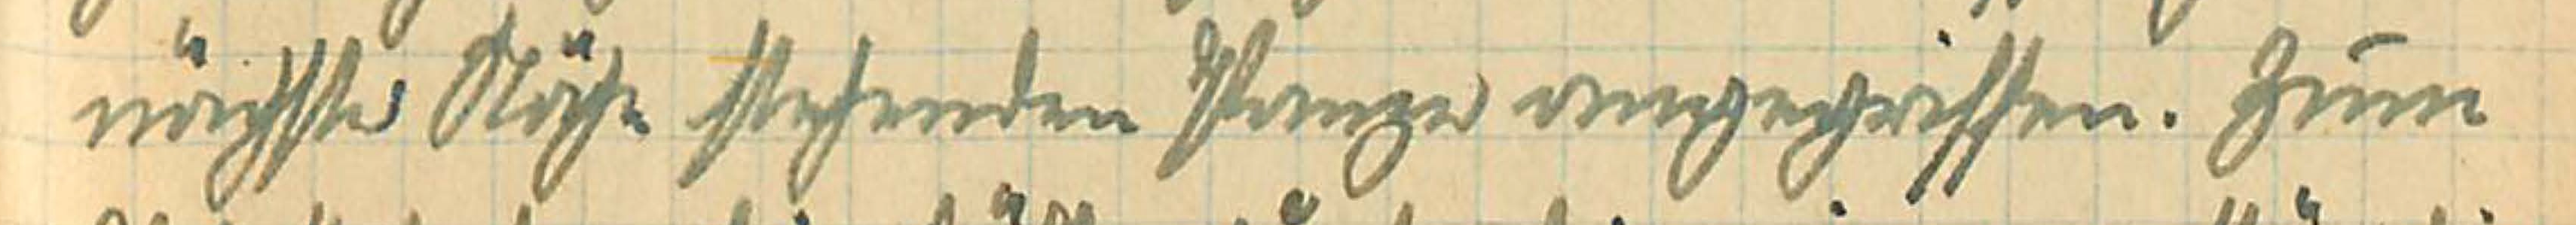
nächster Nähe stehenden Panzer angegriffen. Zum
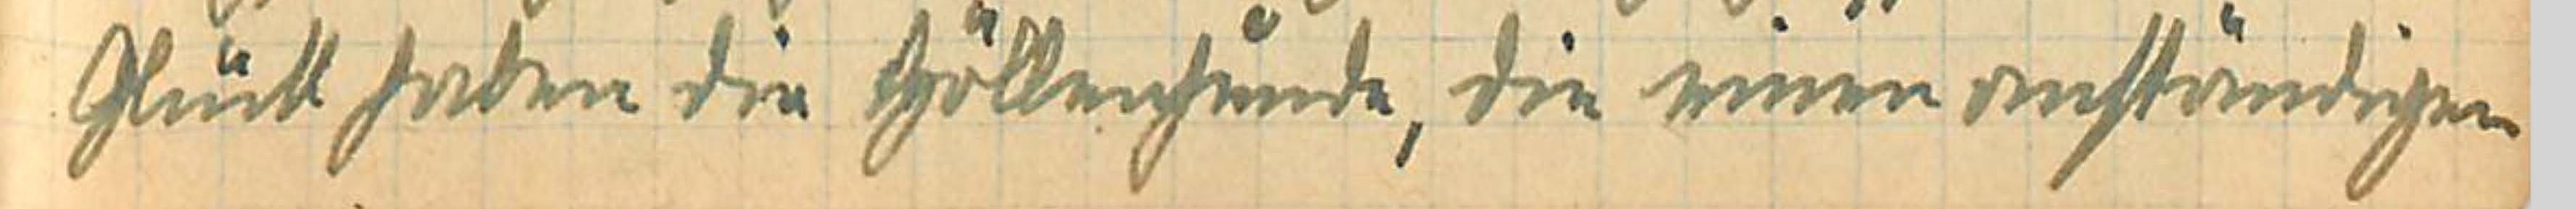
Glück haben die Höllenhunde, die einen anständigen
